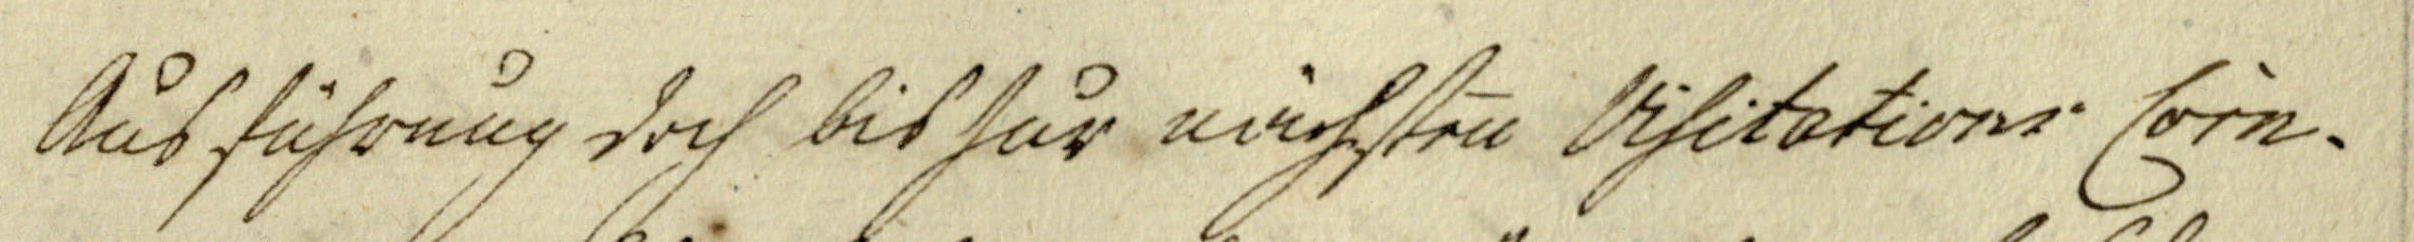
Ausführung doch bis zur nächsten Visitations Com¬
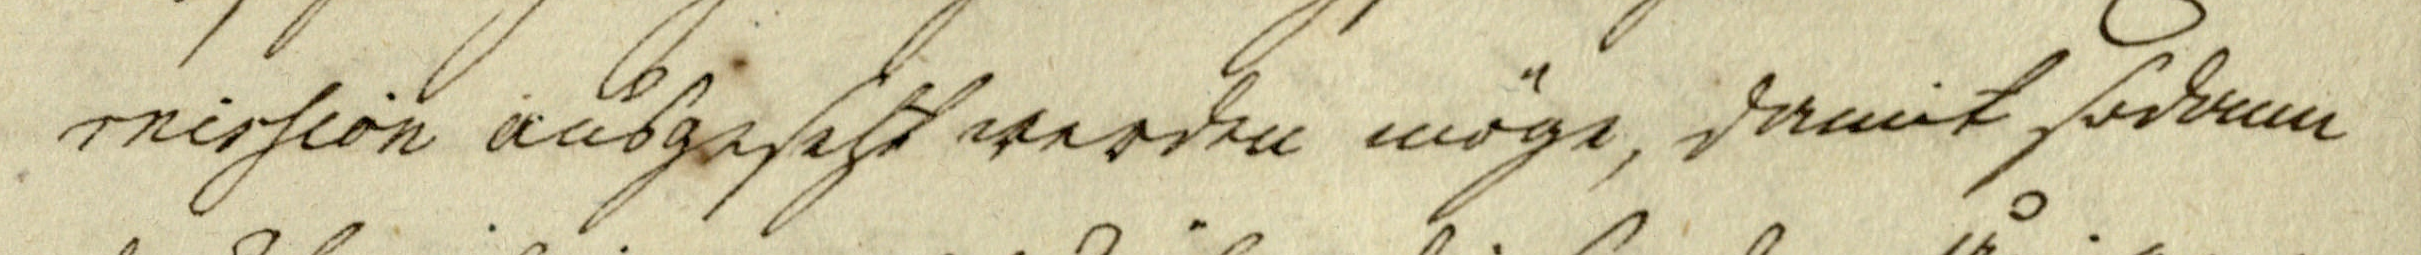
mission ausgesetzt werden möge, damit sodann
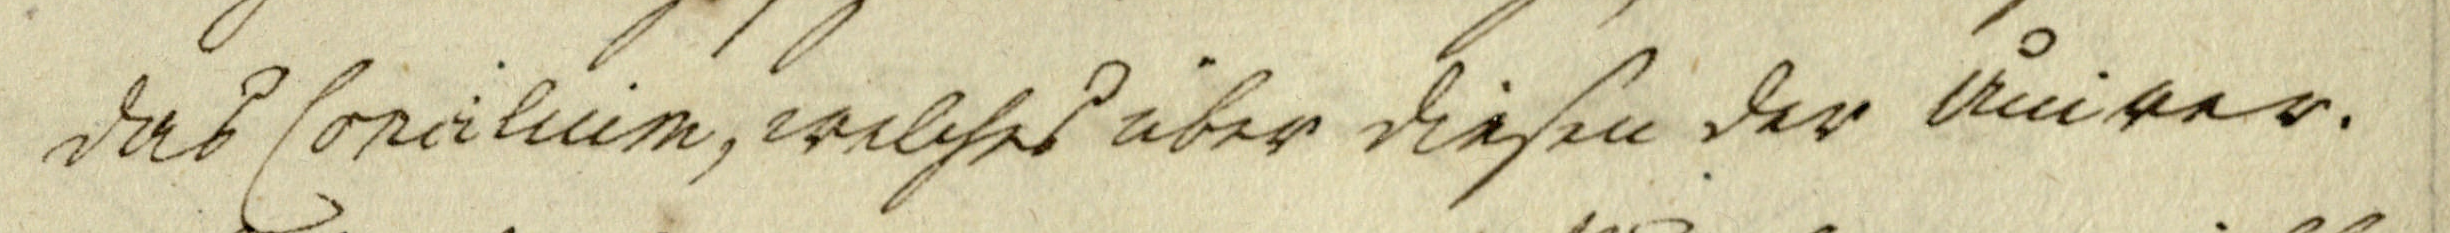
das Concilium, welches über diesen der Univer¬
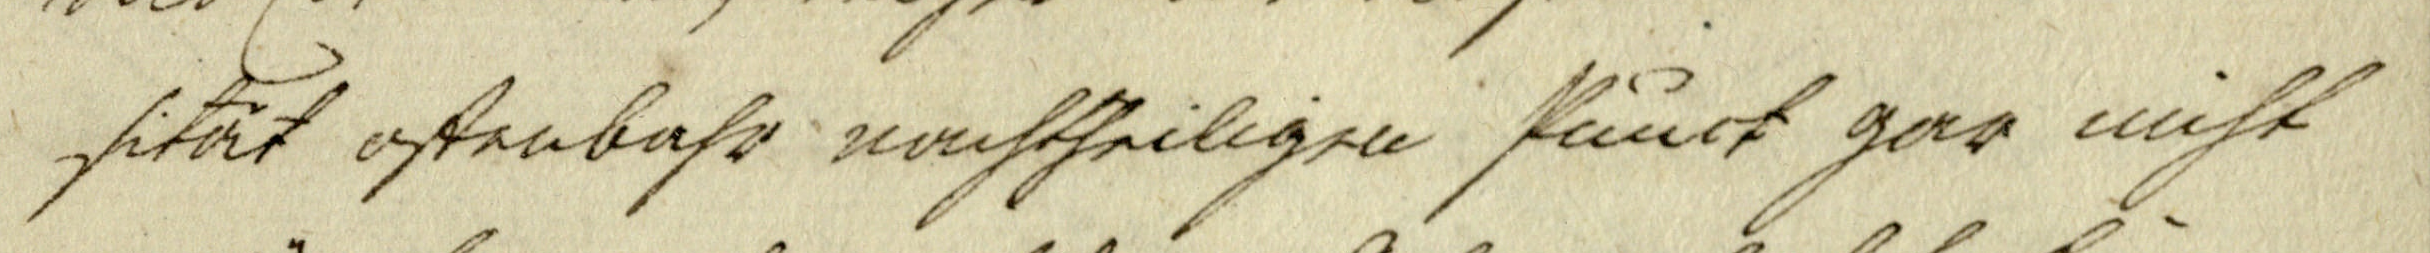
sität offenbahr nachtheiligen Punct gar nicht
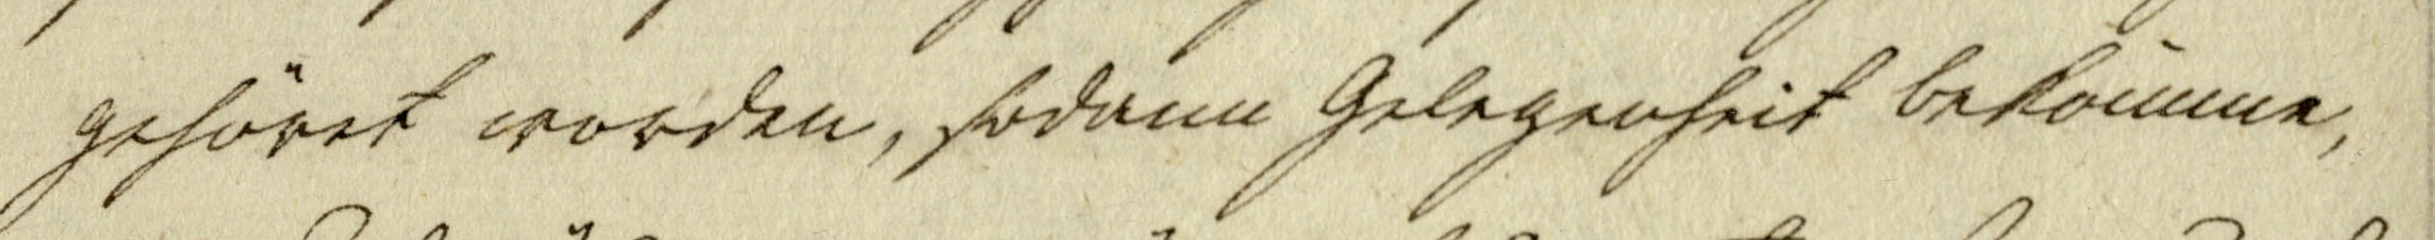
gehöret worden, sodann Gelegenheit bekomme,
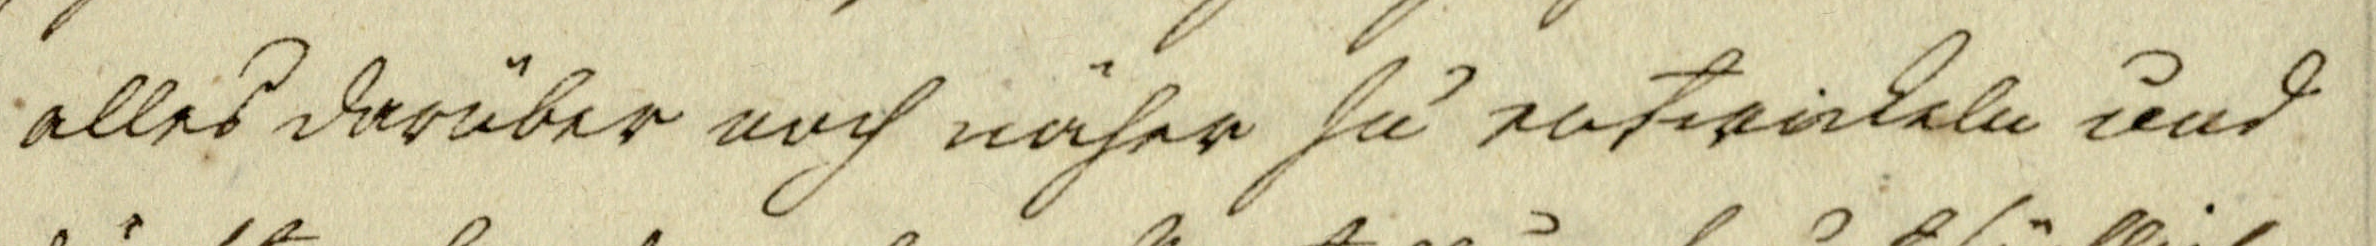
alles darüber noch näher zu entwickeln und
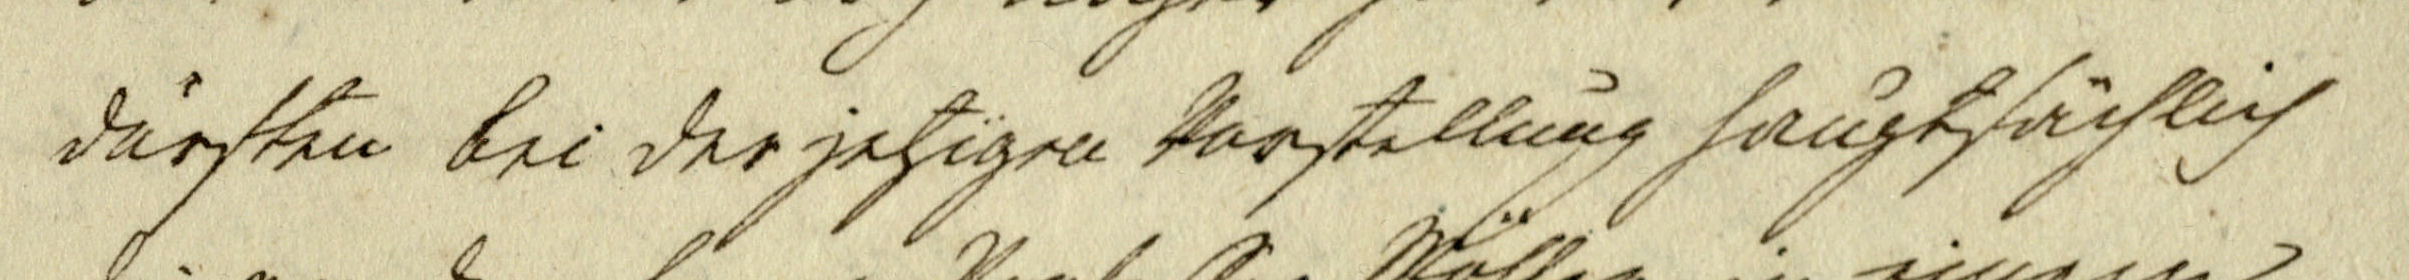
dürften bei der jetzigen Vorstellung hauptsächlich
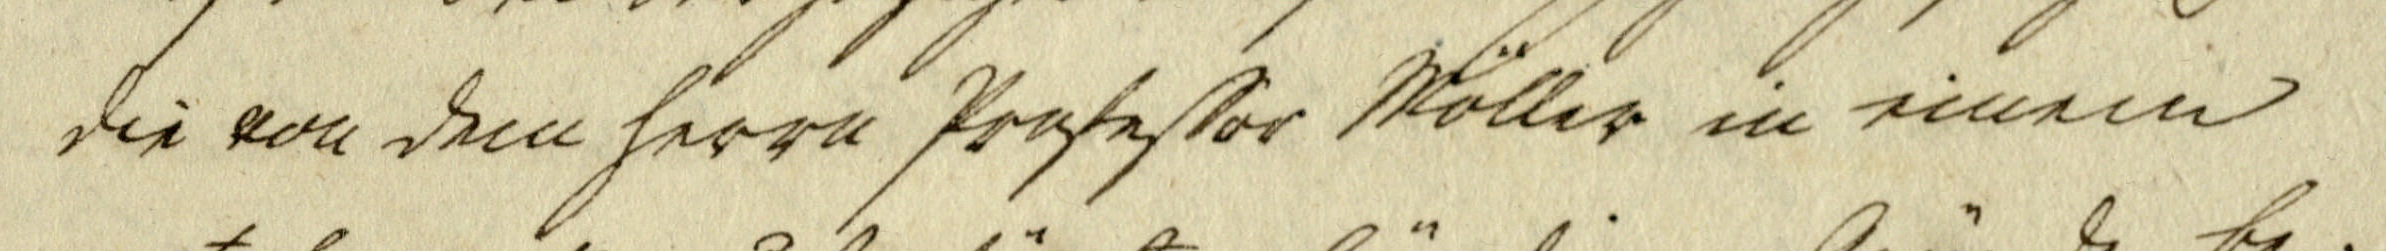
die von dem Herrn Professor Möller in einem
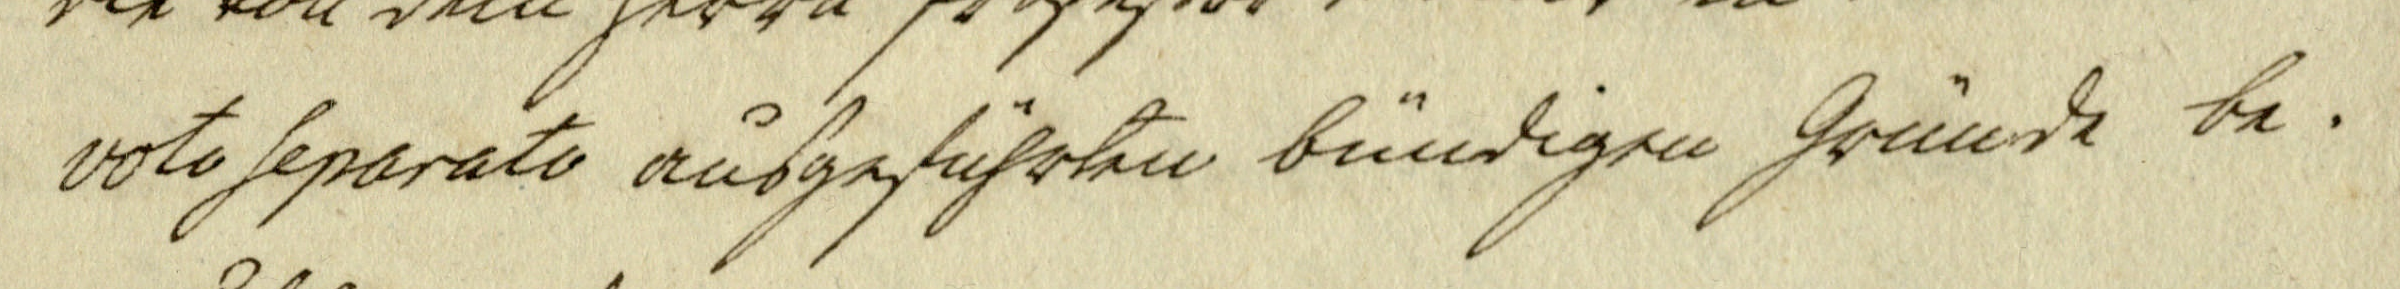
voto separato ausgeführten bündigen Gründe be¬
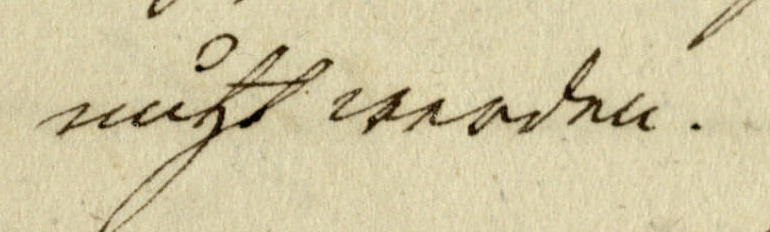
nutzt werden.
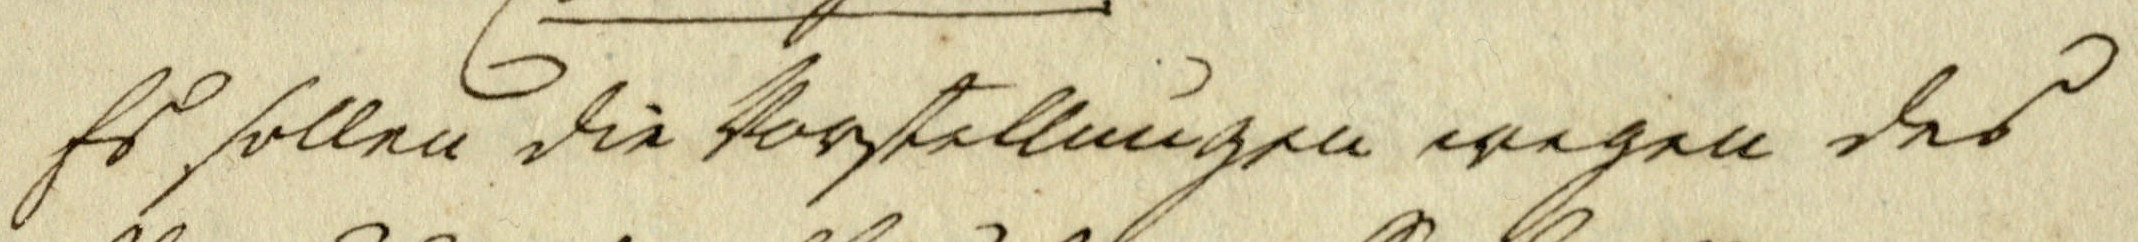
Es sollen die Vorstellungen wegen des
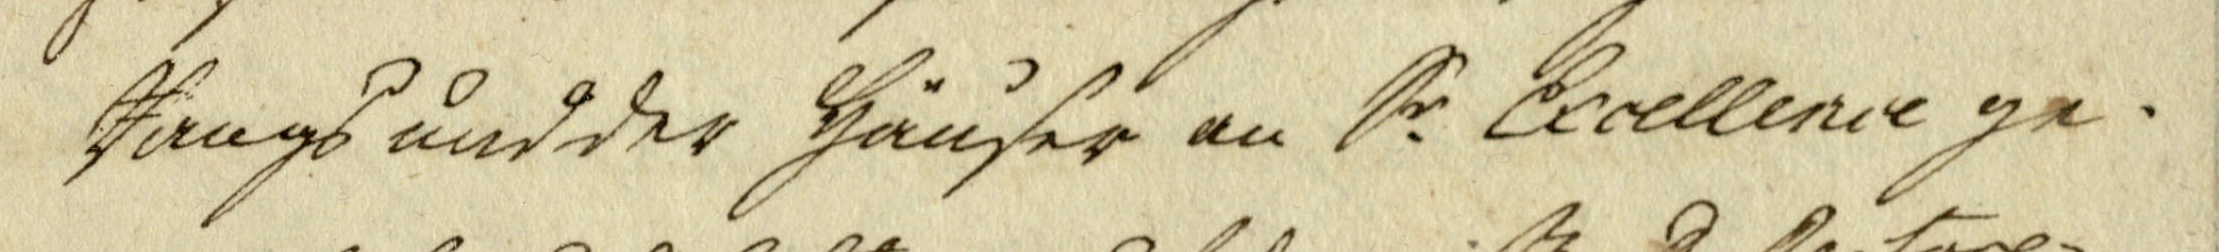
Rangs und der Häuser an Sr. Excellence ge¬
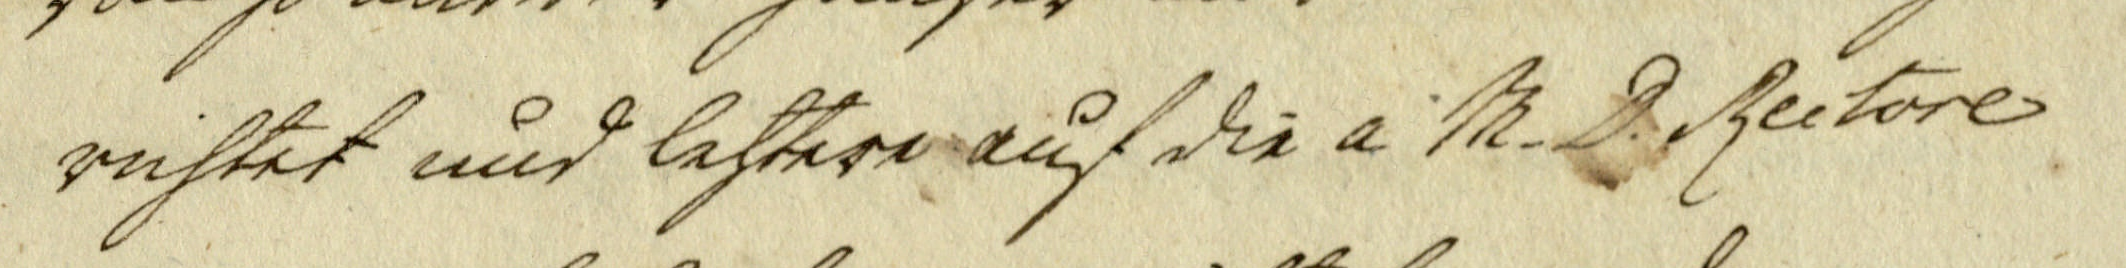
richtet und letztere auf die a M. D. Rectore
